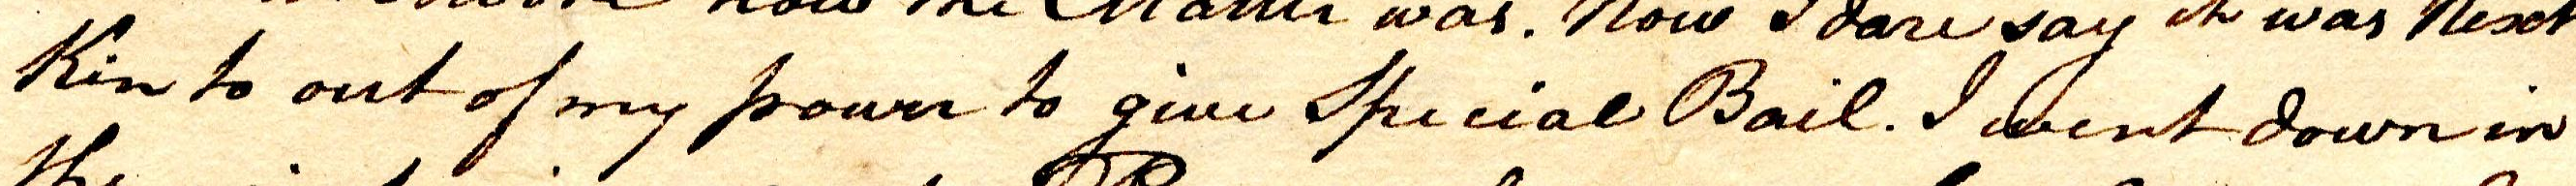kin to out of my power to give Special Bail. I went down in
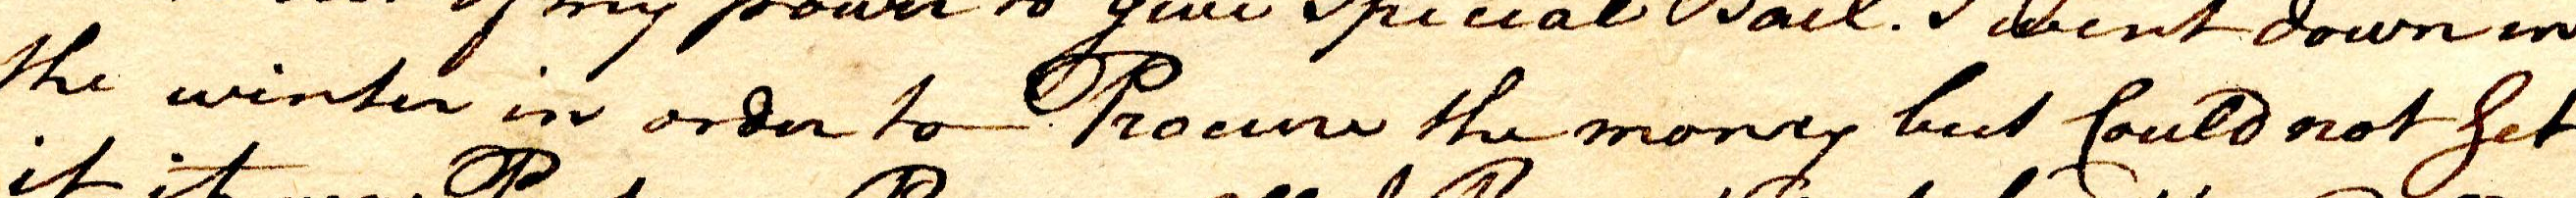the winter in order to Procure the money but Could not Get
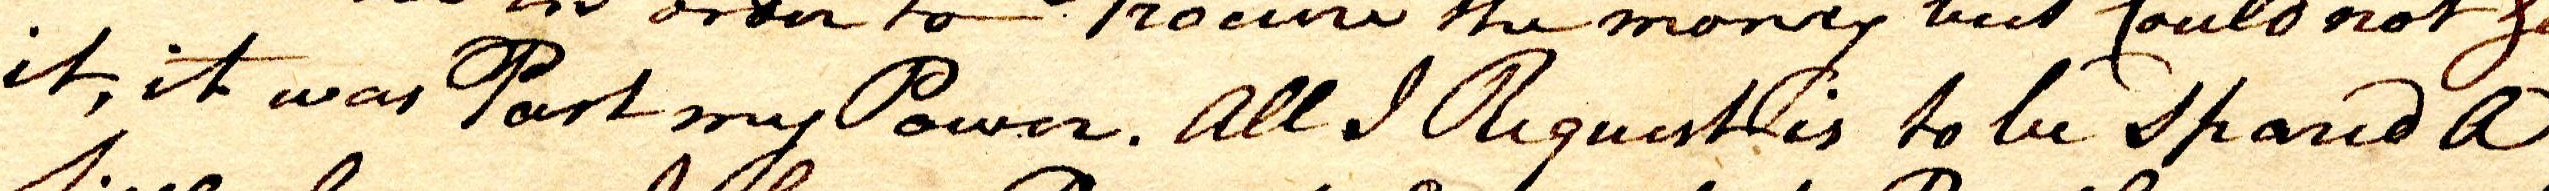it, it was Part my Power. All I Request is to be spared A
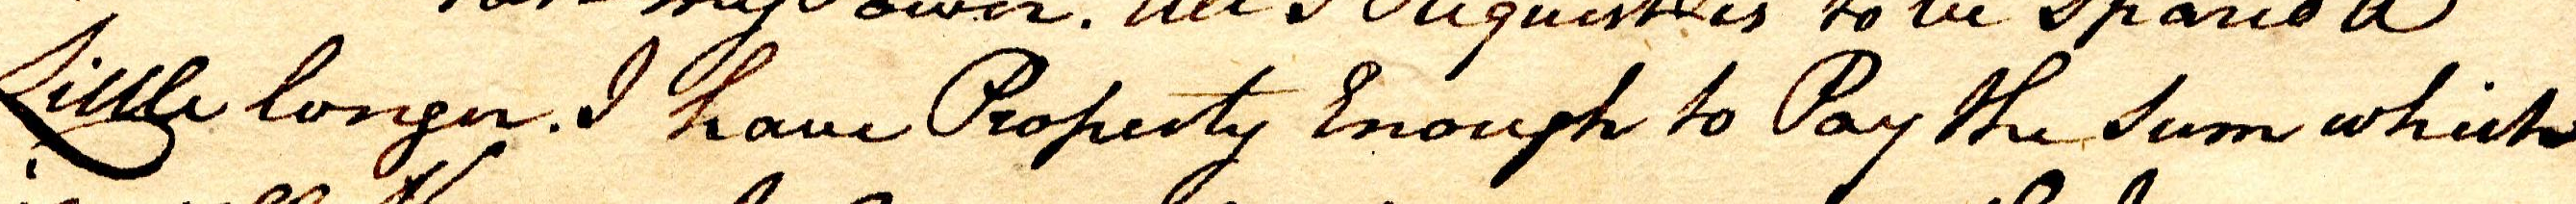little longer. I have Property Enough to Pay the sum which
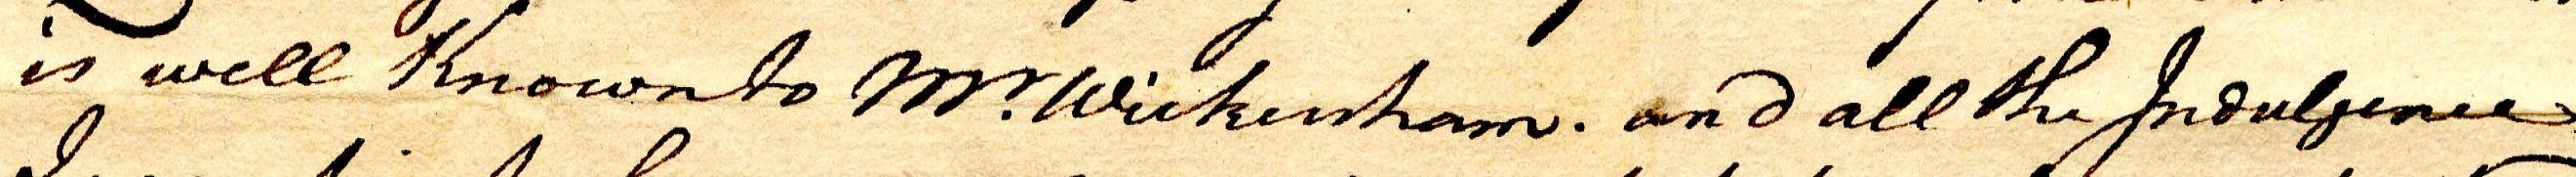is well Known to M^r. Wickersham. and all the Indulgence
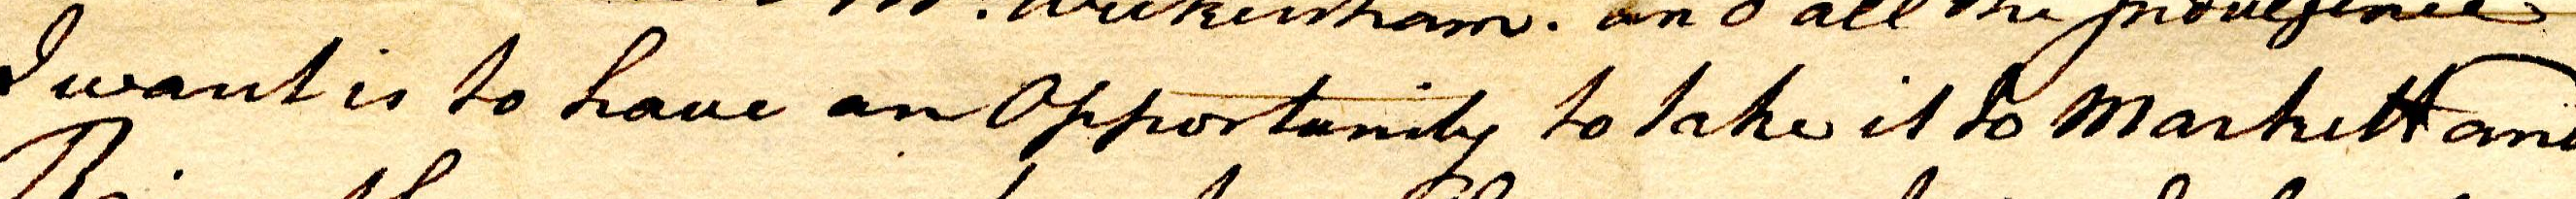I want is to have an Opportunity to take it to Markett and
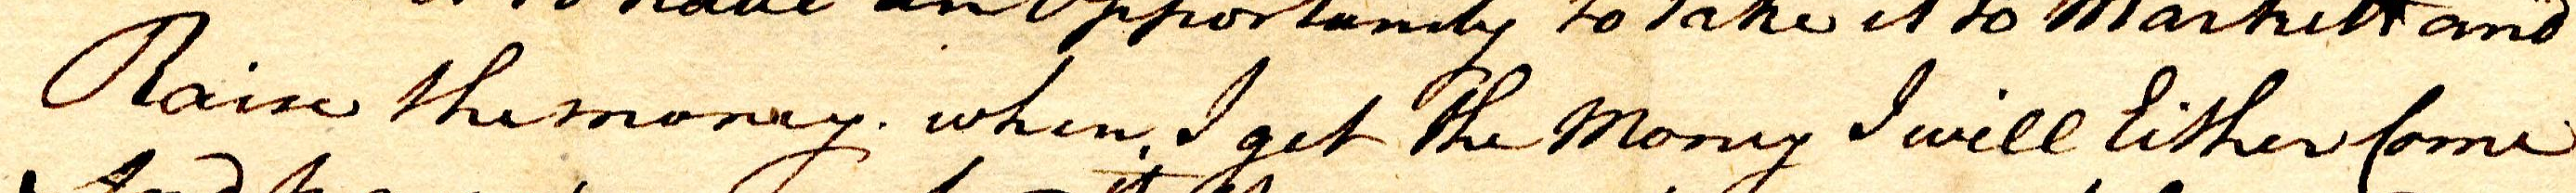Raise the money when, I get the money I will Either Come
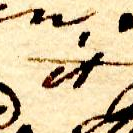it
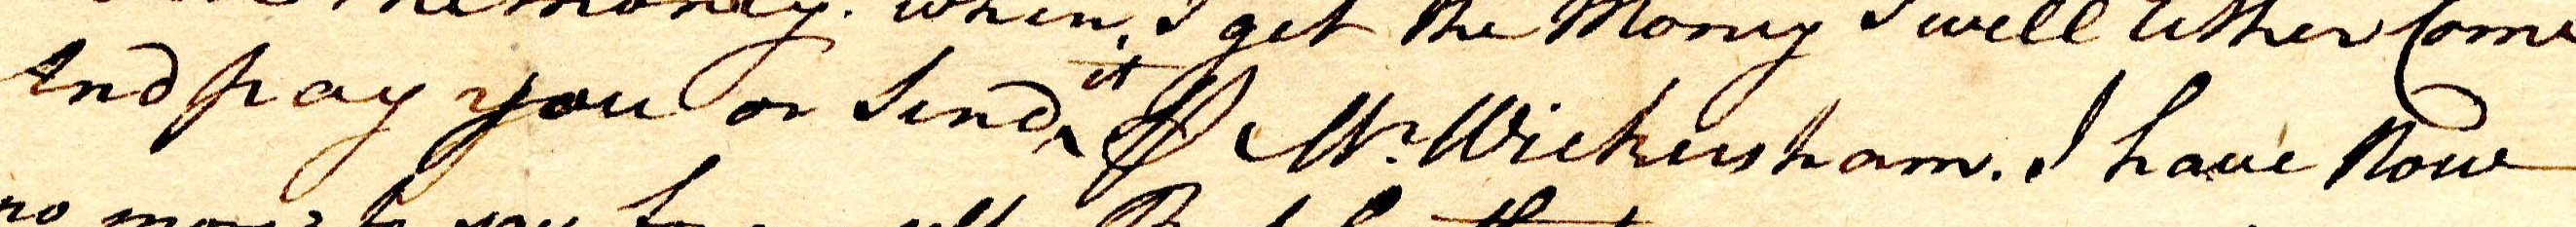And pay you or Send ^ per M^r. Wickersham. I have Now
